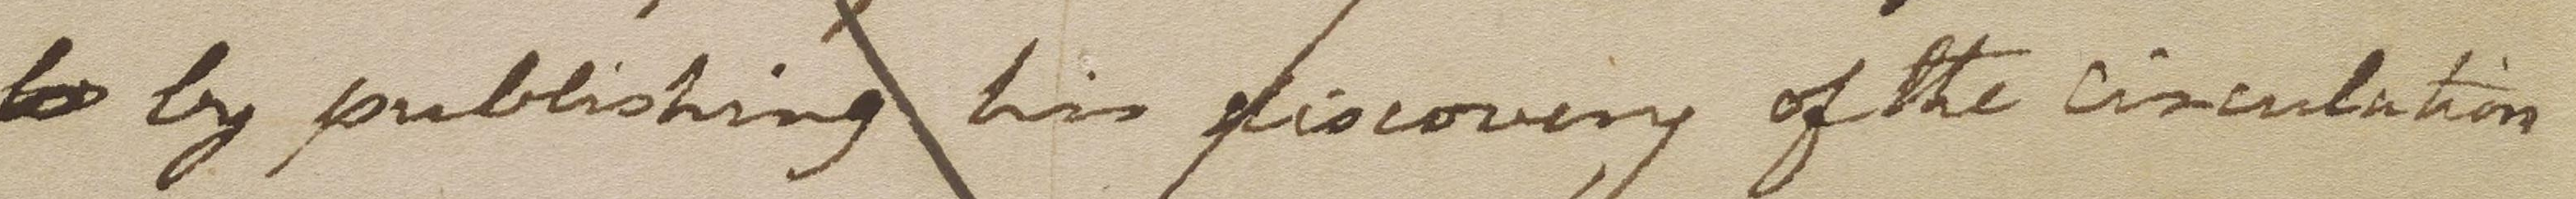by publishing his discovery of the circulation
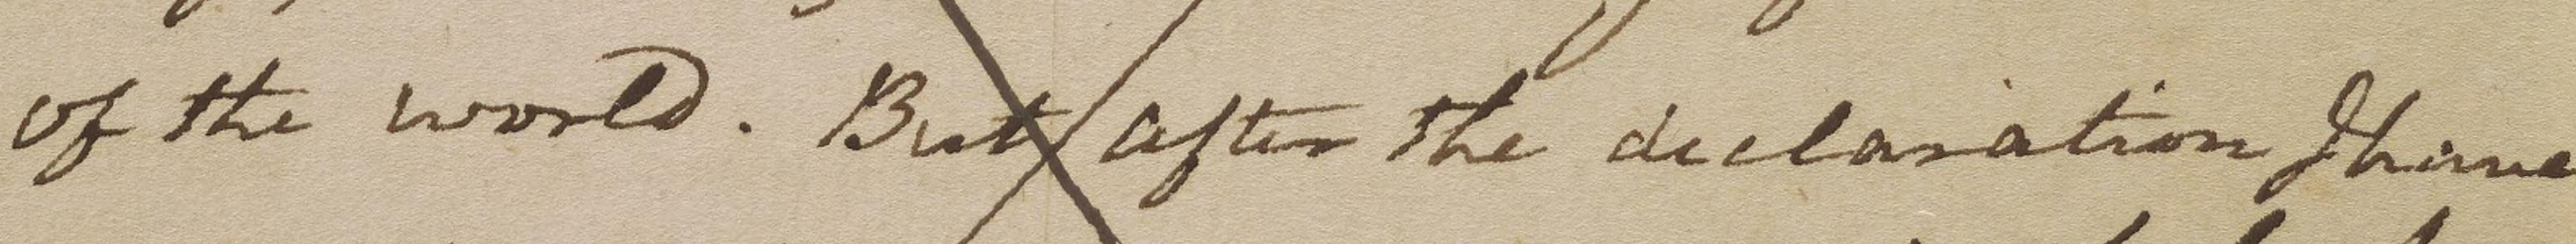of the world. But after the declaration I have
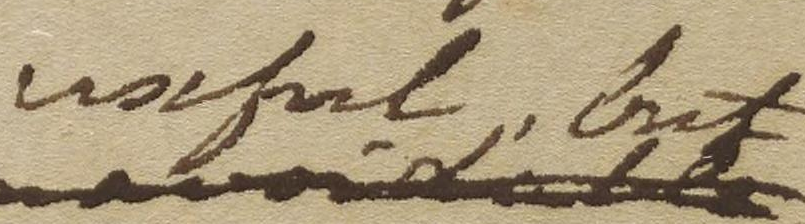useful, but
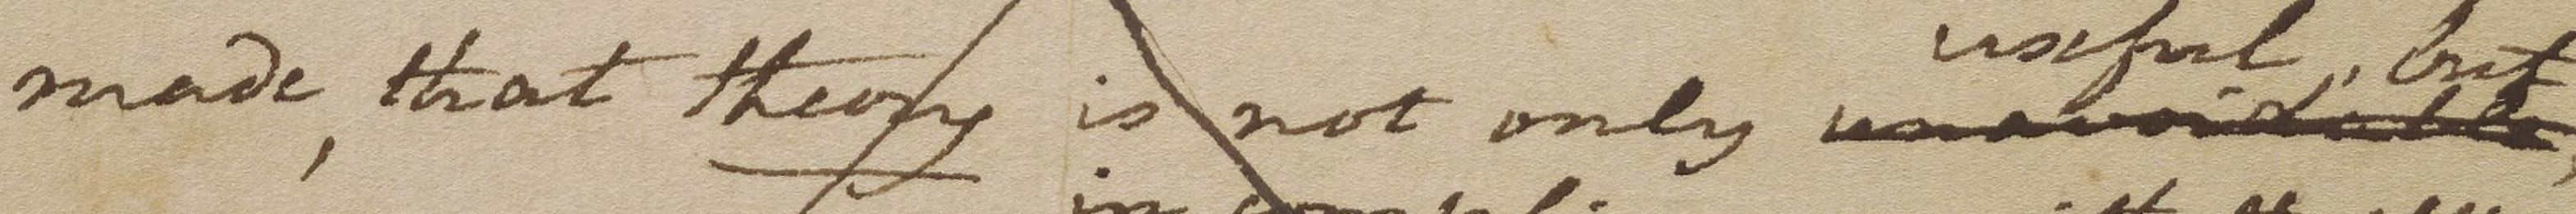made that theory is not only [unavoidable]
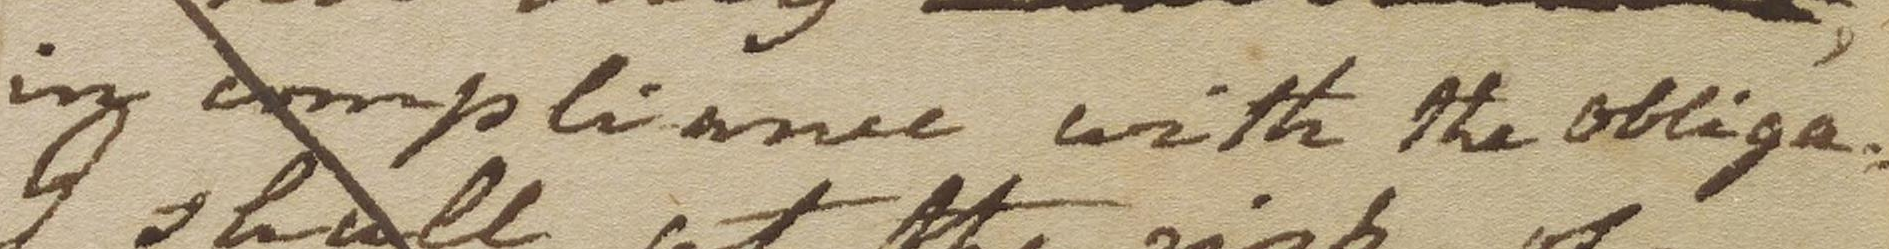in complicance with the obliga-
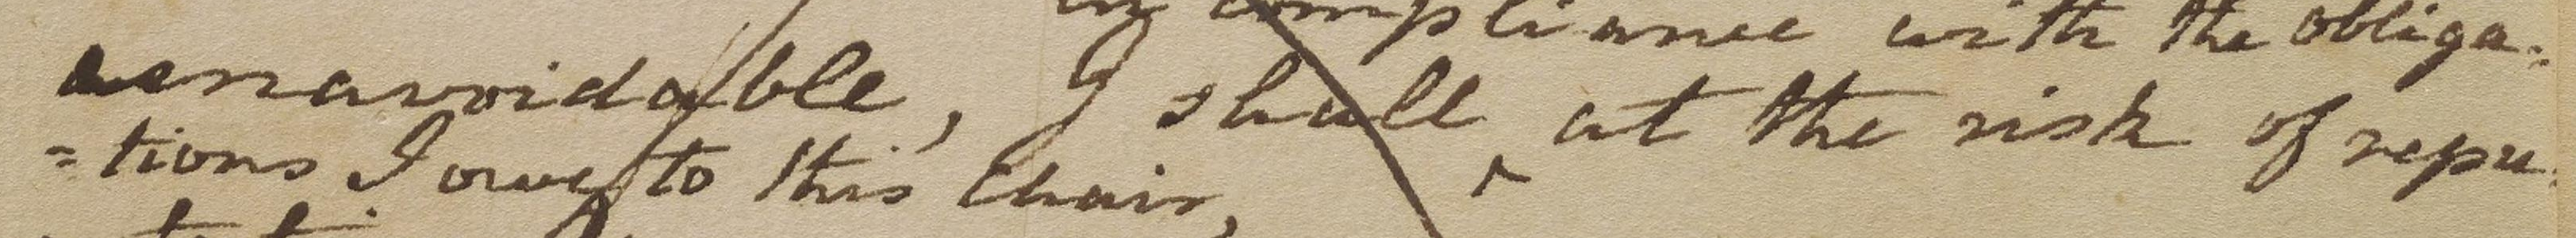unavoidable, I shall ^ at the risk of repu-
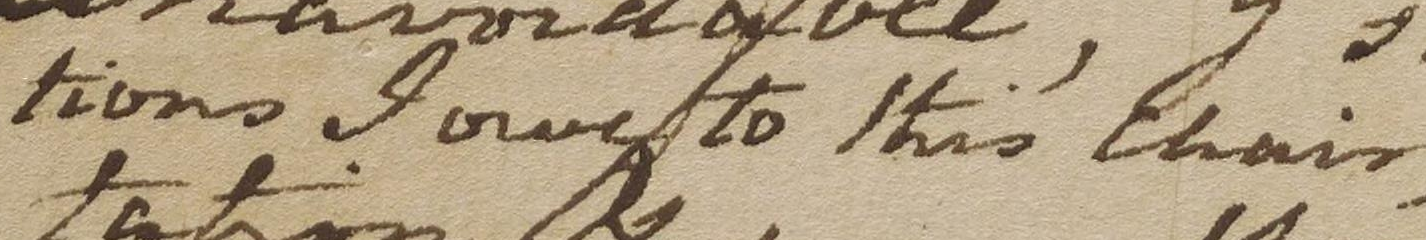-tions I owe to this chair
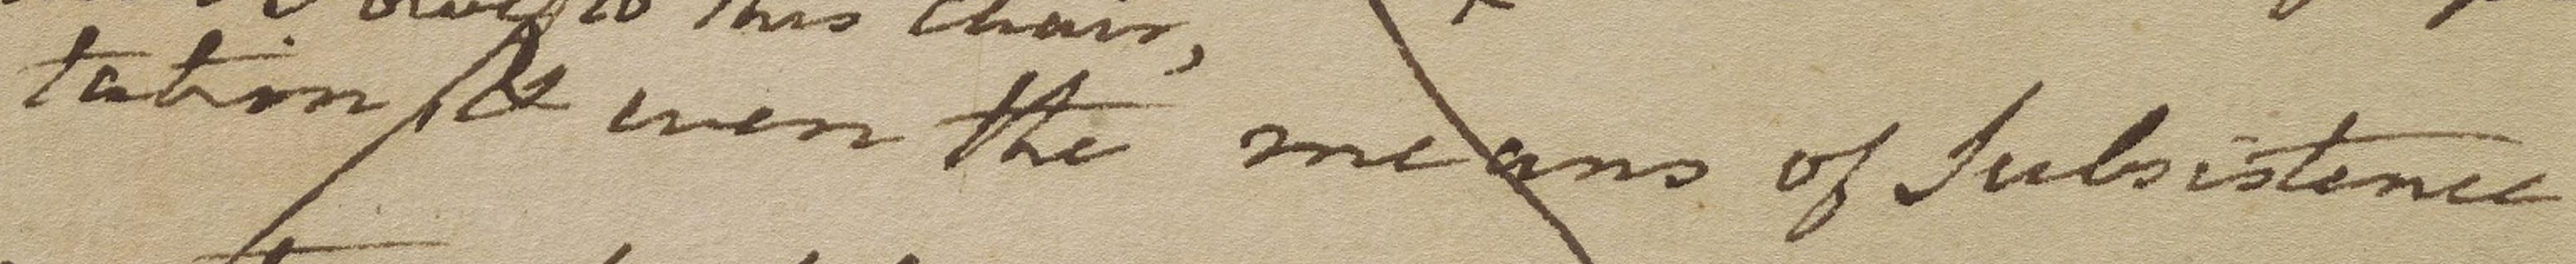-tation & even the means of subsistence
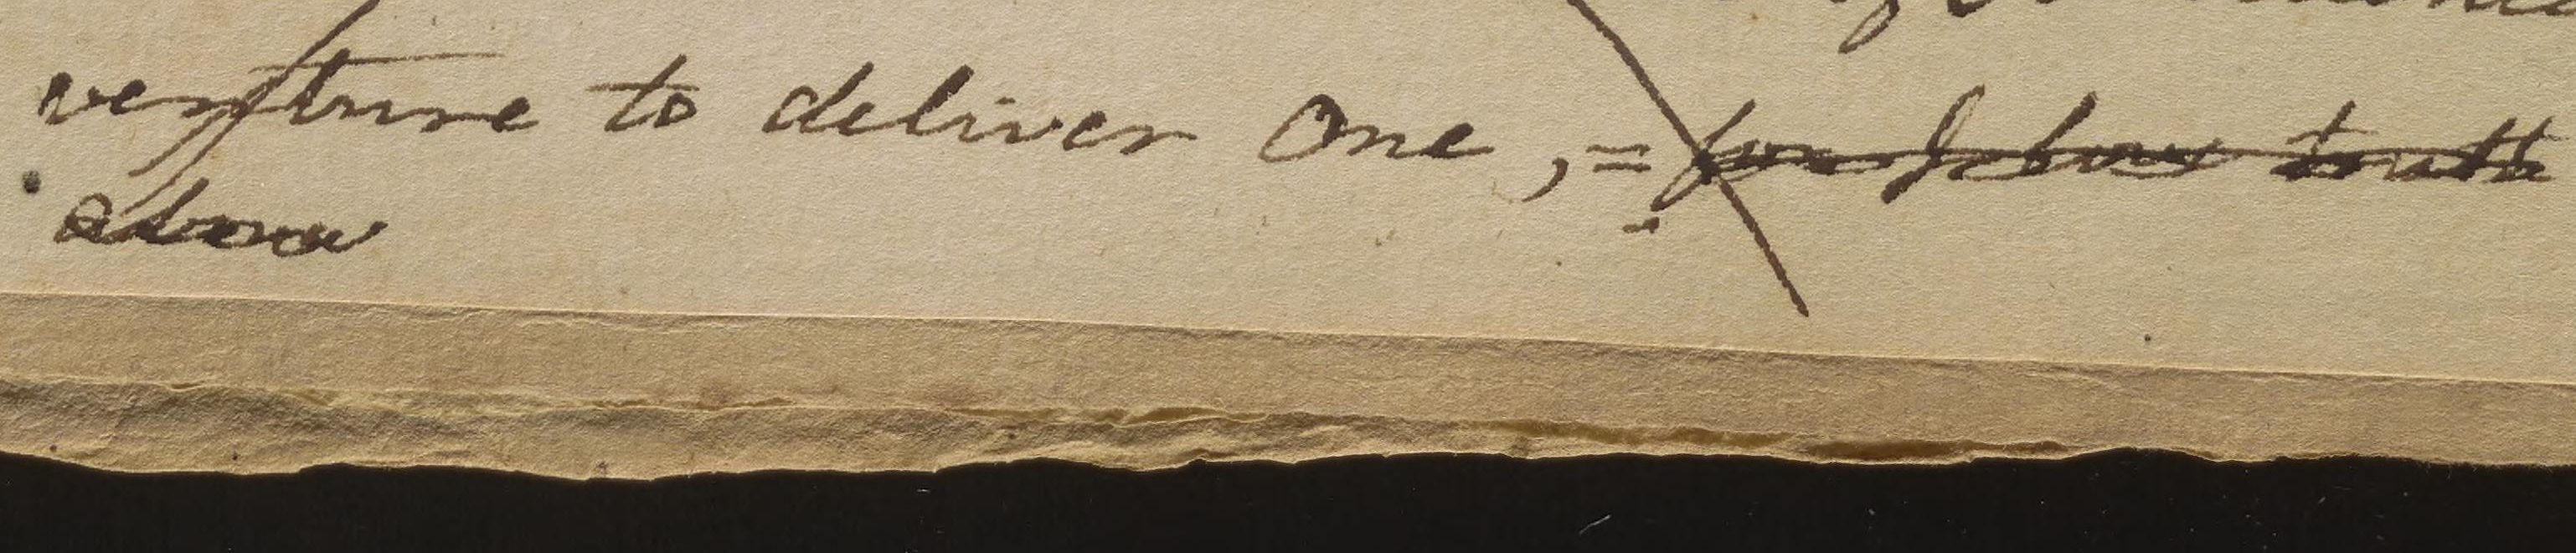venture to deliver one,
